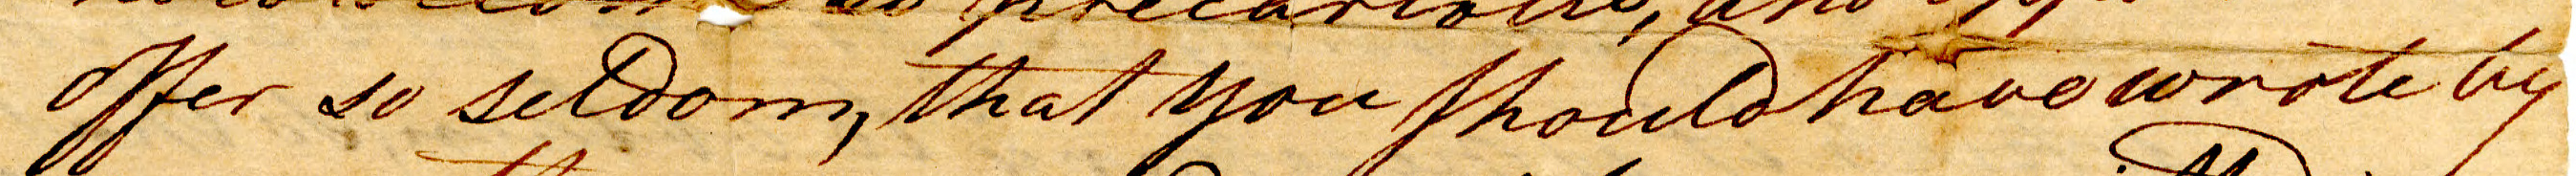offer so seldom, that you should have wrote by
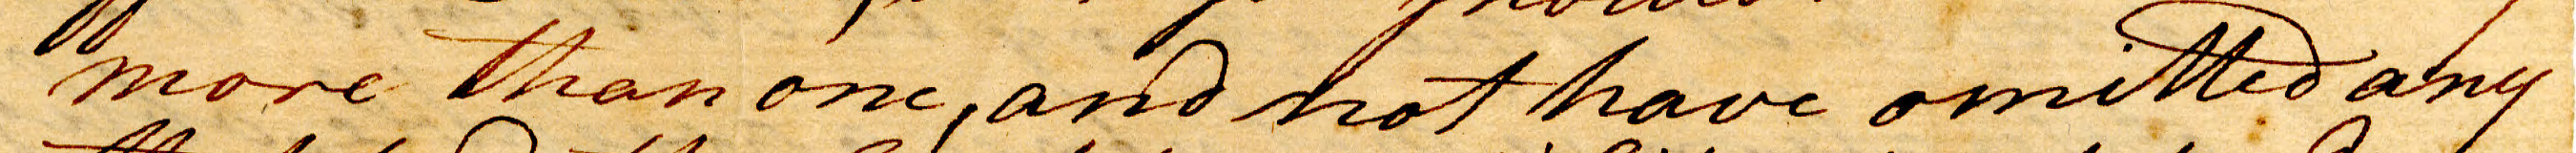more than one, and not have omitted any
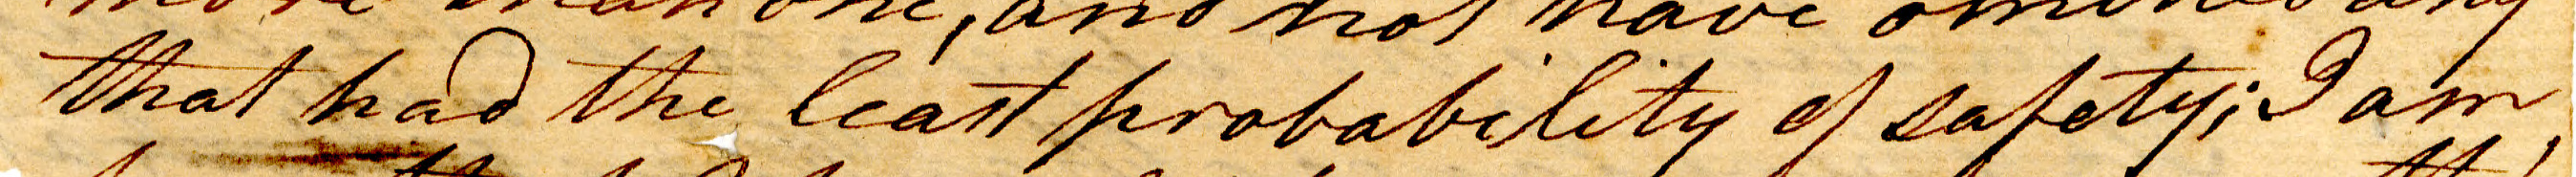that had the least probability of safety; I am
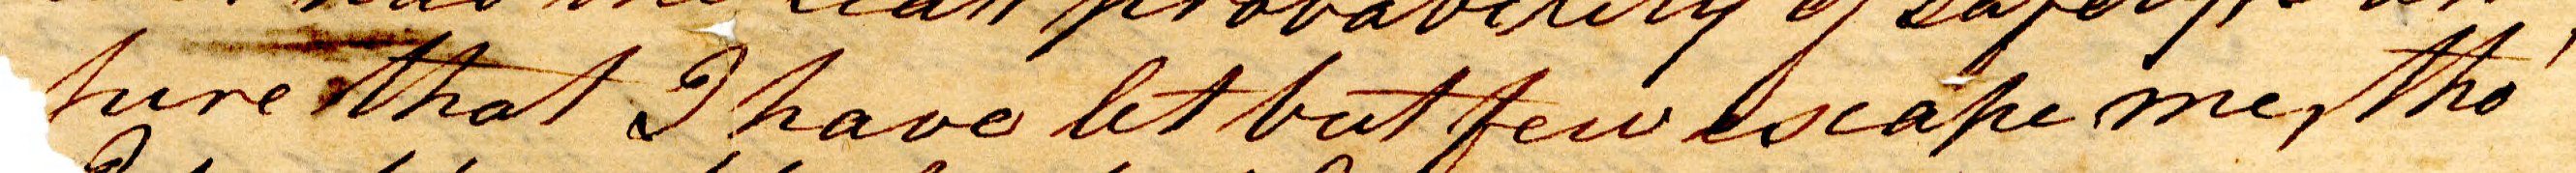sure that I have let but few escape me, tho'
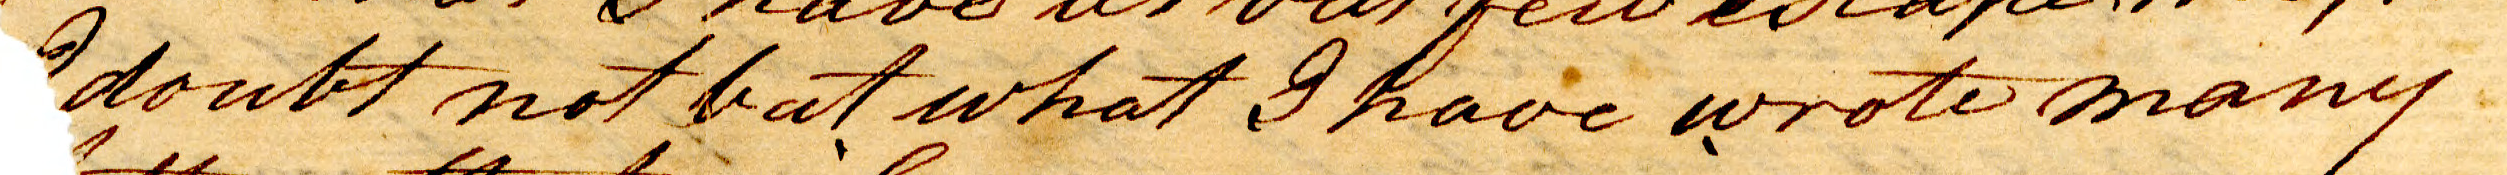I doubt not but what I have wrote many
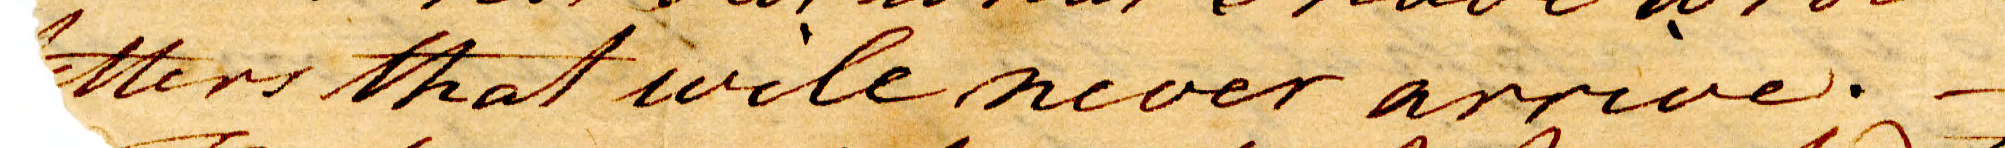letters that will never arrive.-
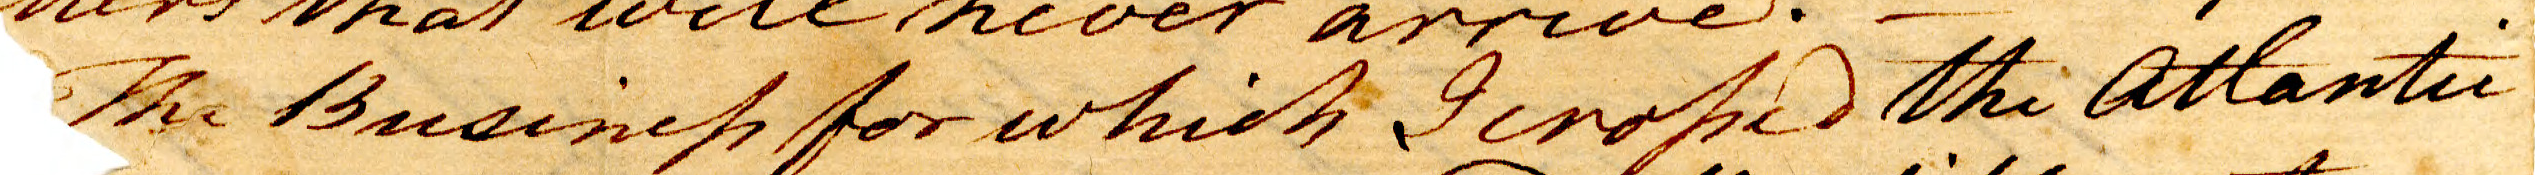The Business for which I crossed the Atlantic
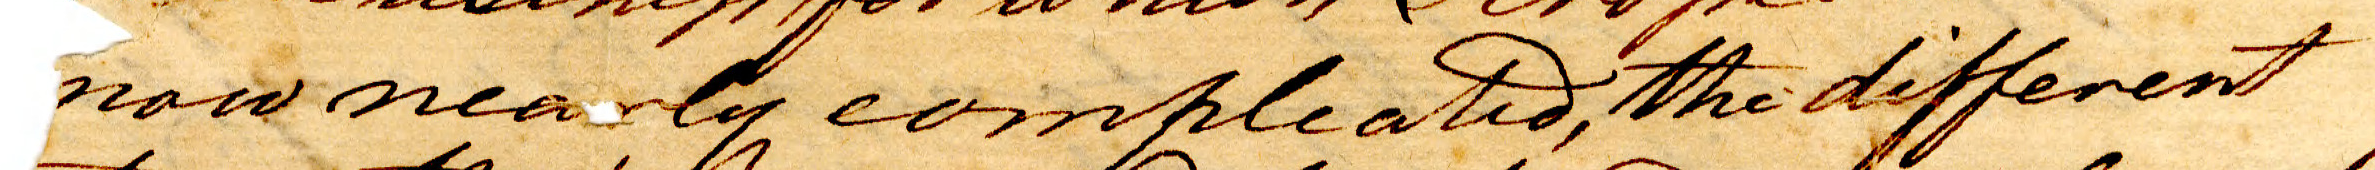now nearly compleated, the different
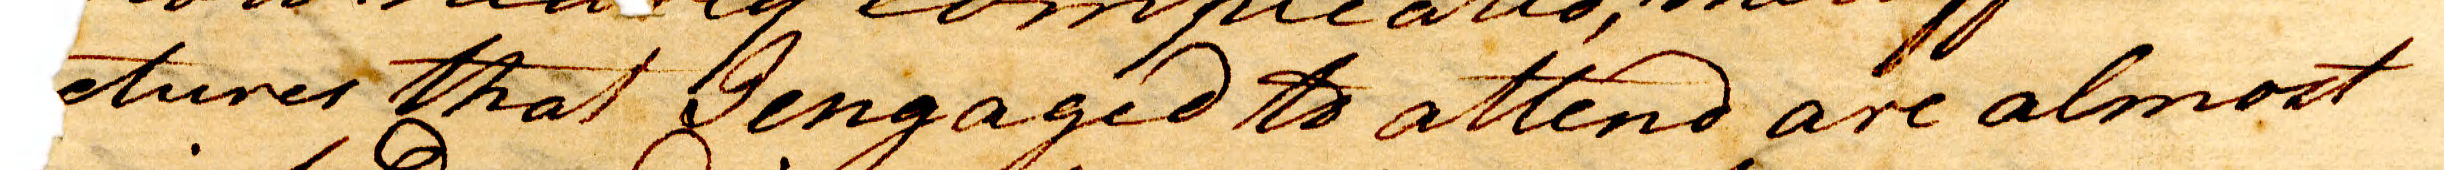ctures that I engaged to attend are almost
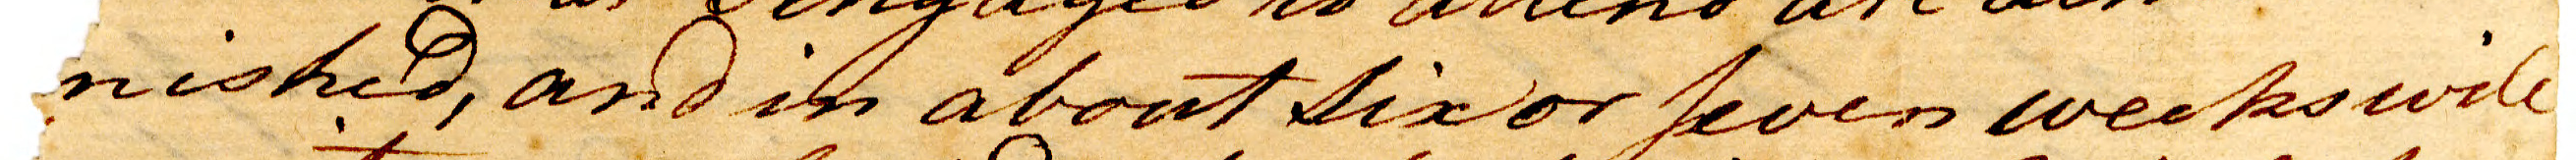nished, and in about six or seven weeks will
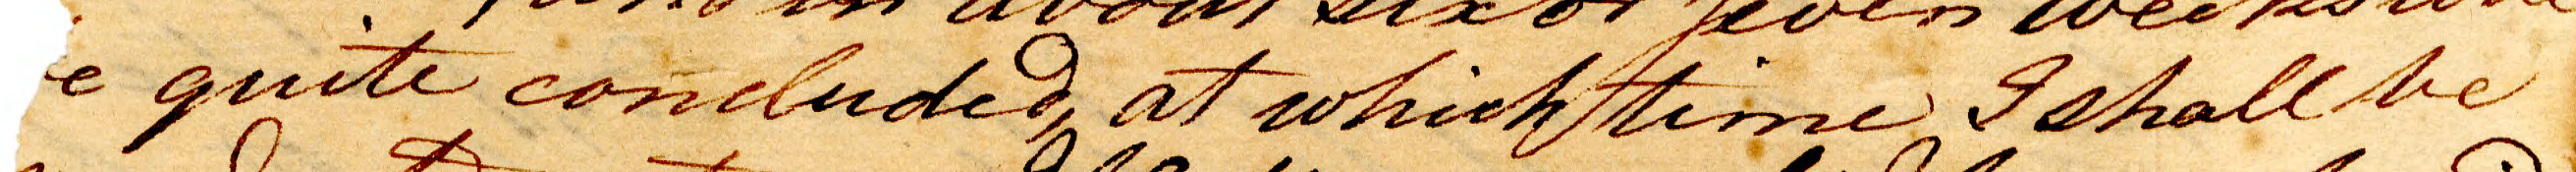e quite concluded, at which time I shall be
